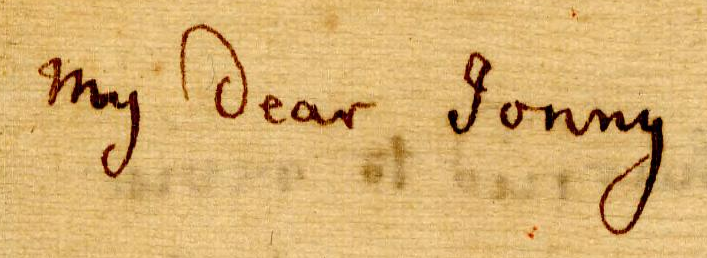my dear Jonny
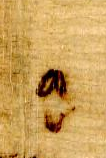a
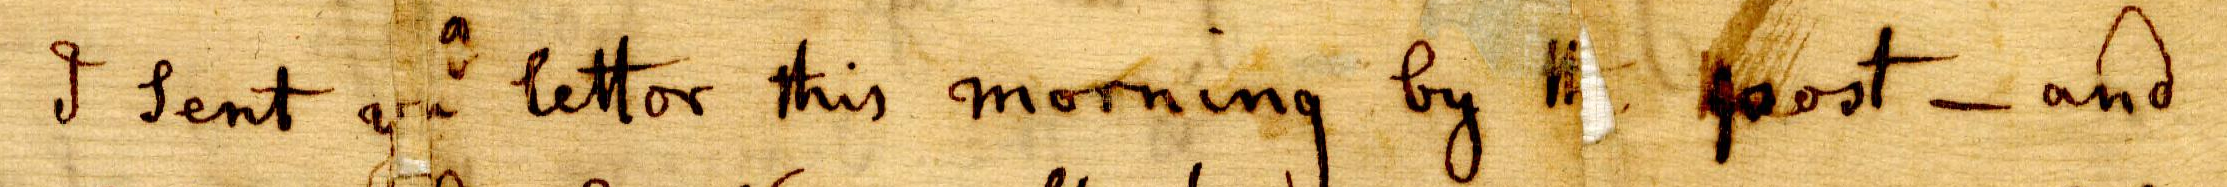I sent you ^ letter this morning by th[_] post- and
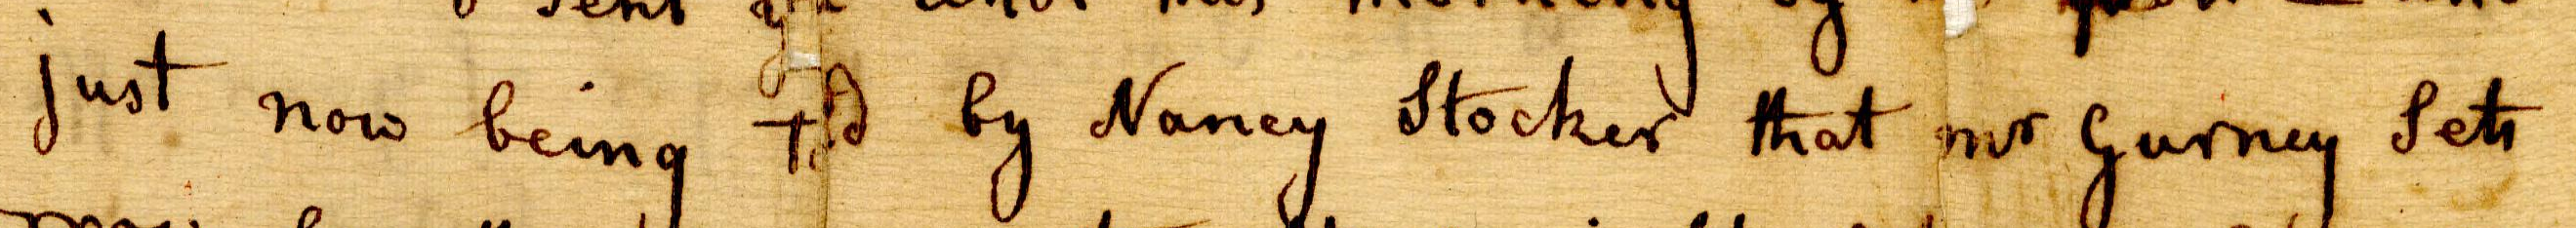just now being t[_]d by Nancy Stocker that m^r Gurney sets
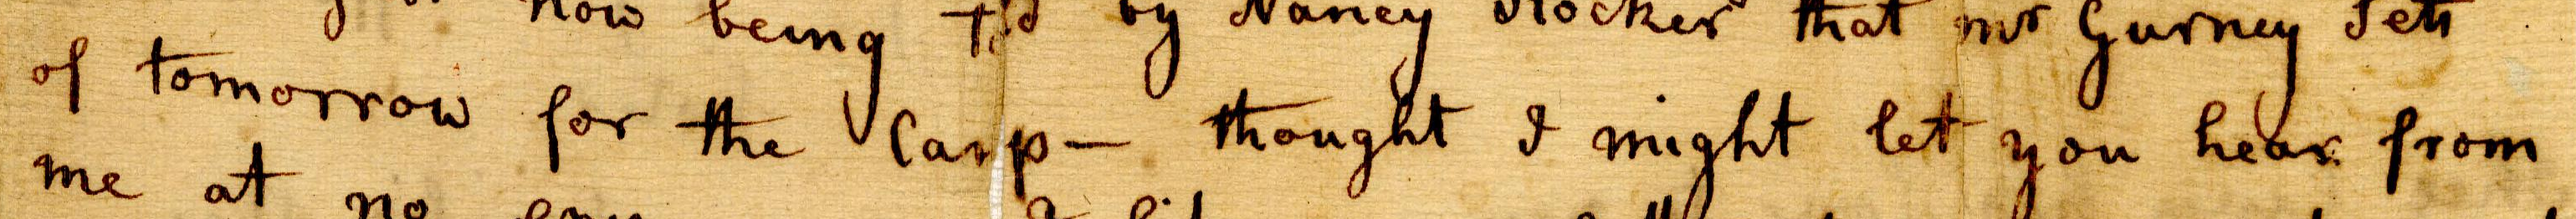of tomorrow for the Camp- thought I might let you hear from
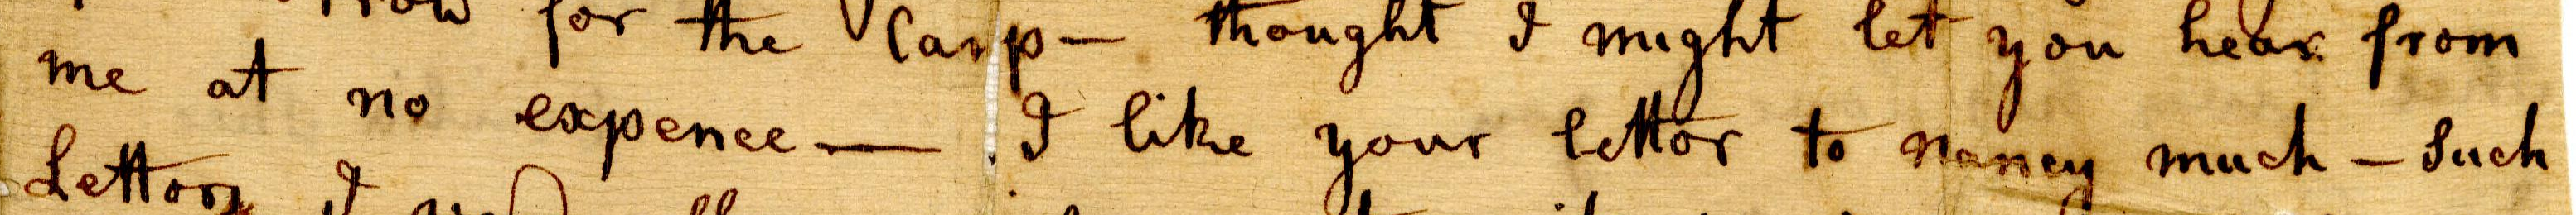me at no expence- I like your letter to nancy much- such
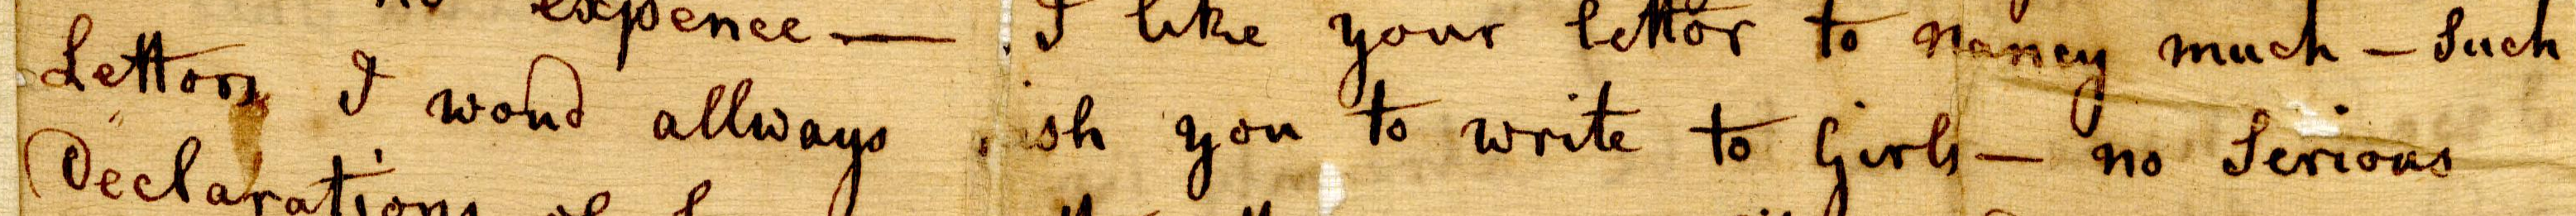Letters I woud allways [_]ish you to write to Girls- no Serious
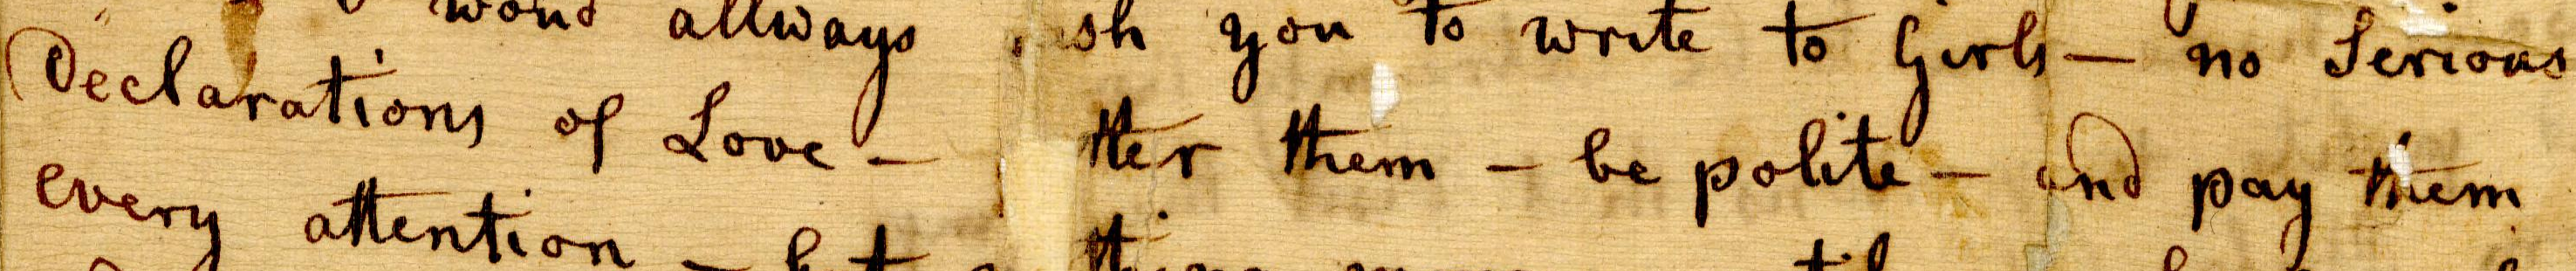declaration of Live- [__]tter them- be polite- and pay them
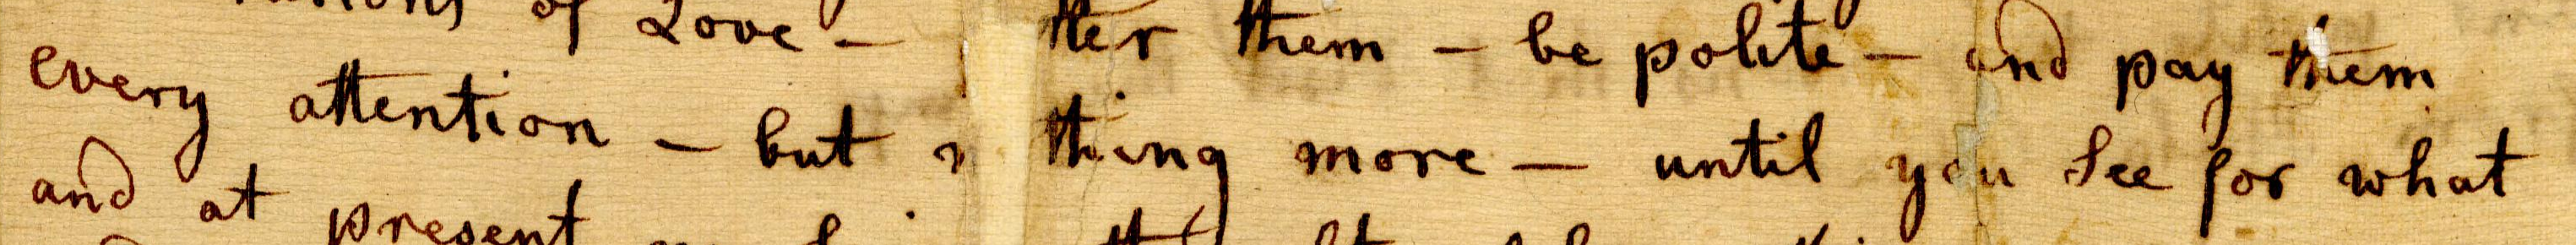every attention- but n[_]thing more- until you see for what
